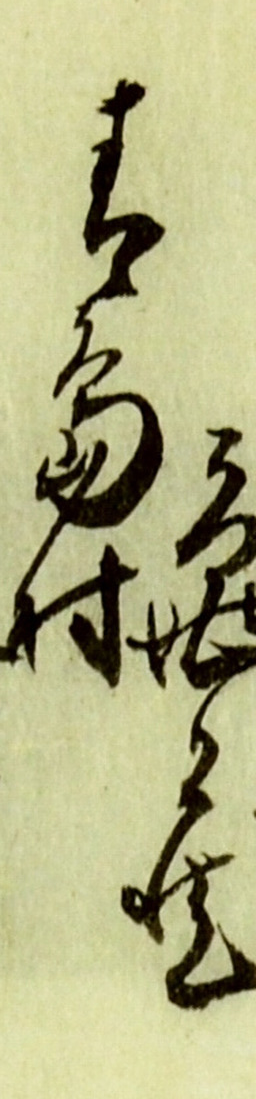青島村
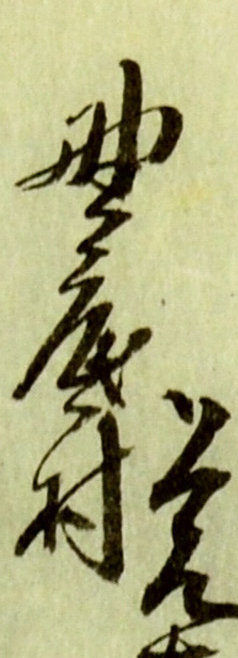野底村

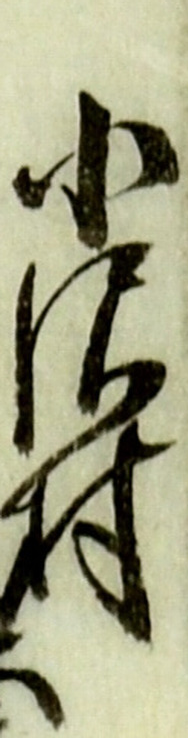小沢村
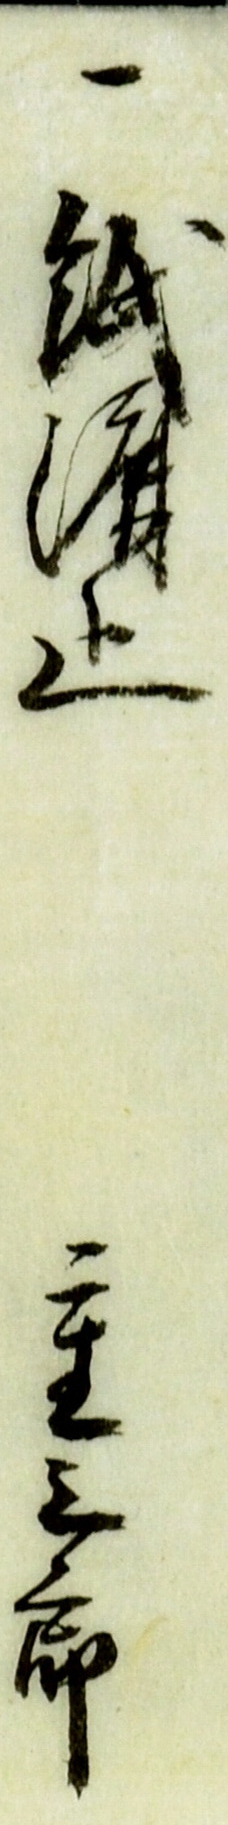一紙漉止重三郎
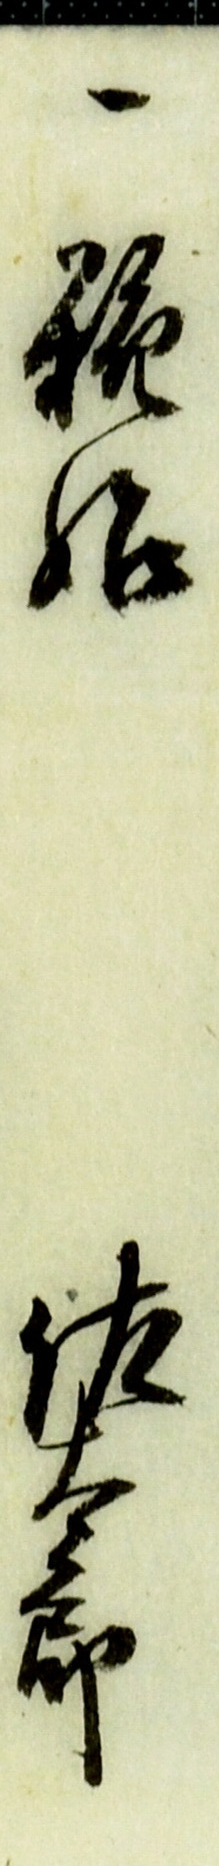一糀始佐太郎
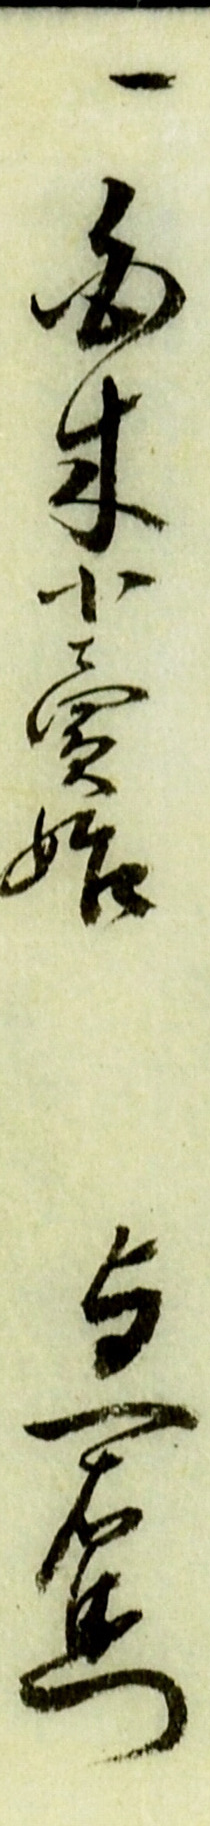一白木小売始与一右衛門
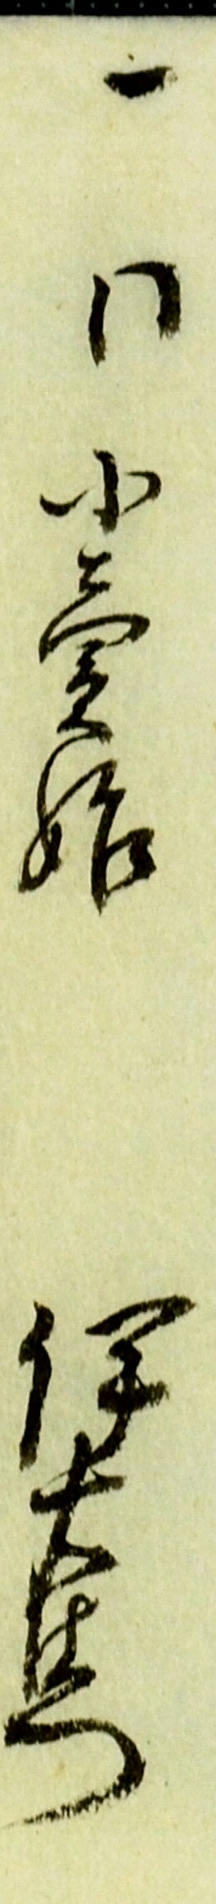一同小売始伊右衛門
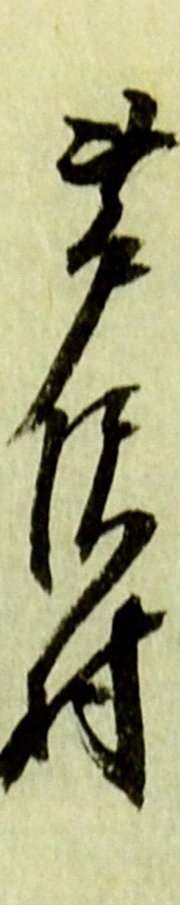芦沢村
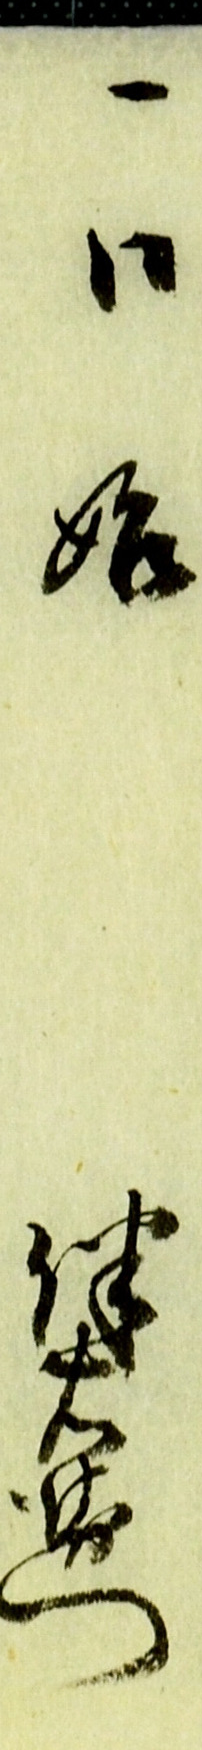一同始伴右衛門
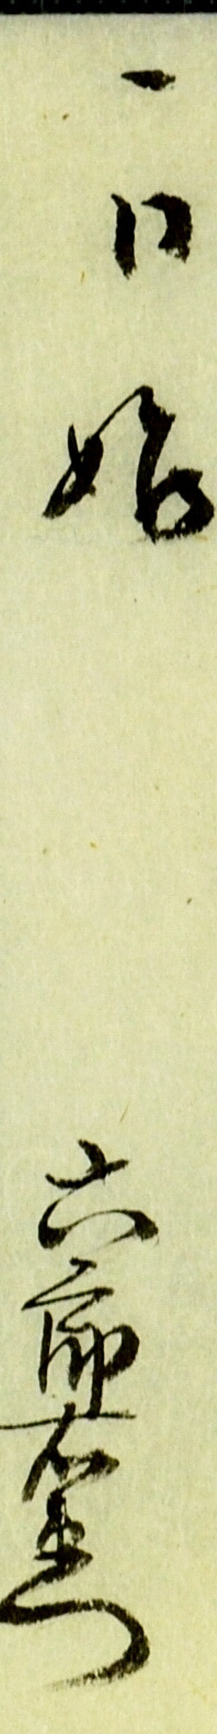一同始六郎右衛門
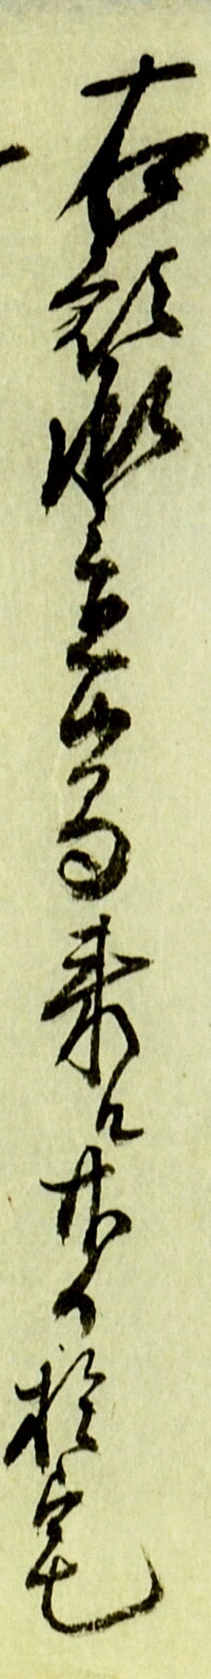右願承置候間来ル廿日於宅
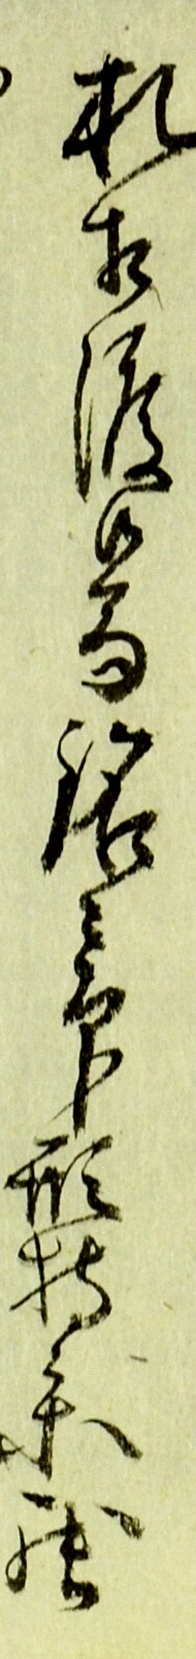札相渡候間銘々印形持参罷
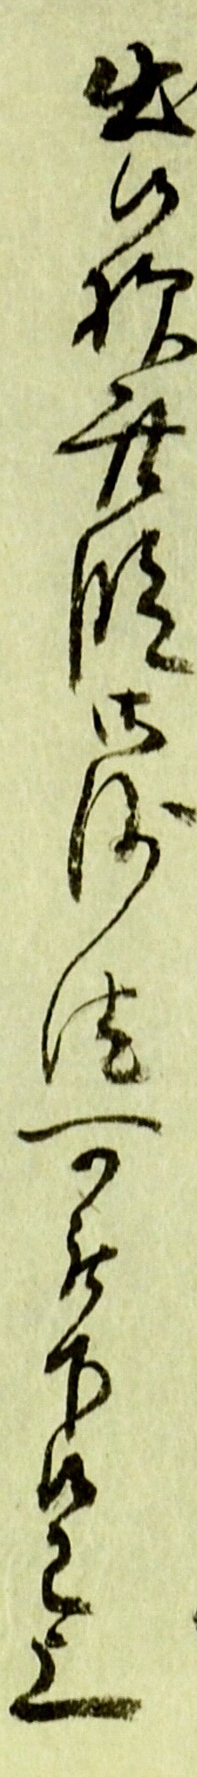出候様此段御沙汰可被下候已上
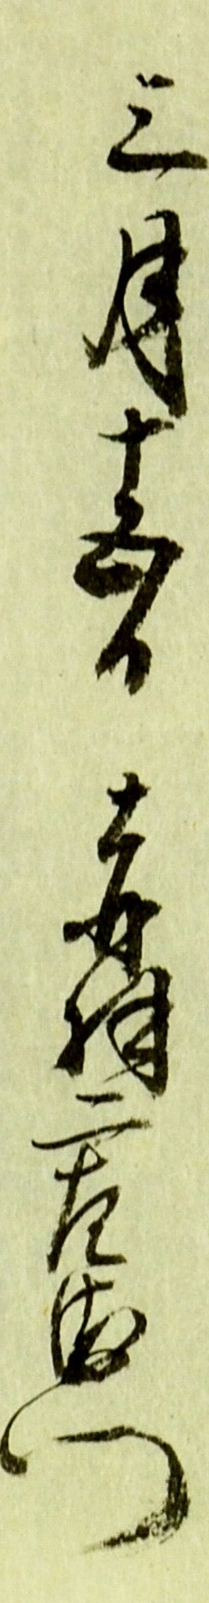三月十五日赤羽二左衛門
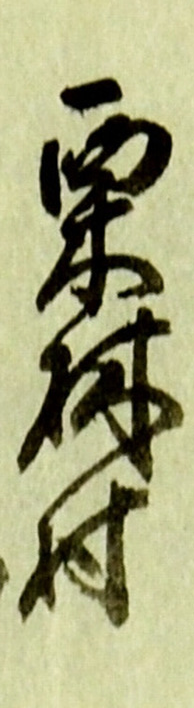栗林村
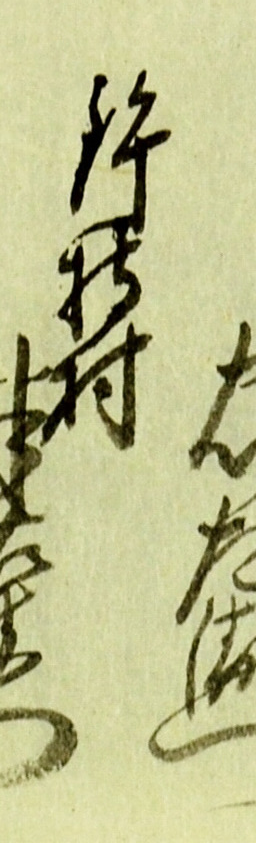鉾持村
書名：郷方掛合帳
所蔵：伊那市立高遠町図書館・合同会社AMANE
